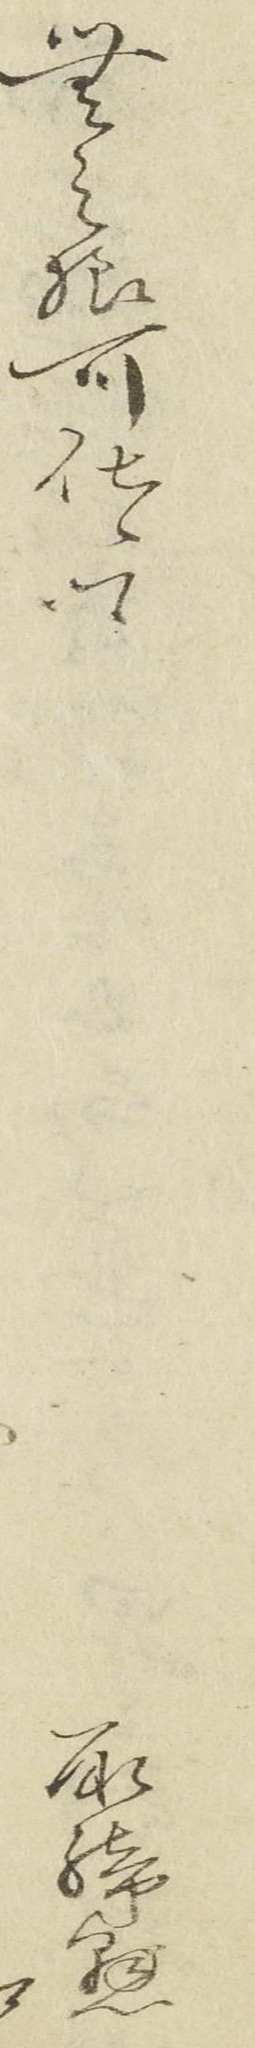無之様可仕候以上取締懸
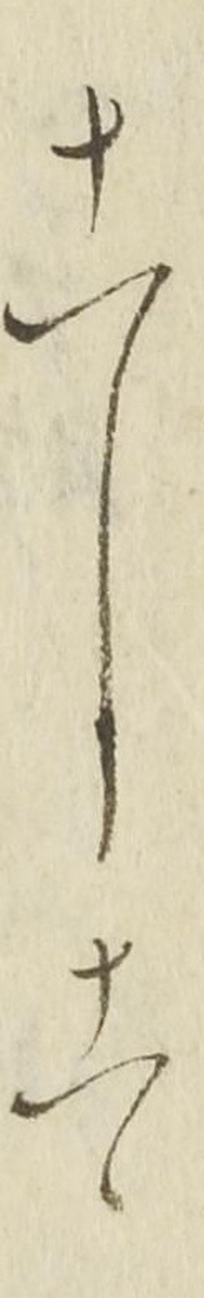十一月十八日
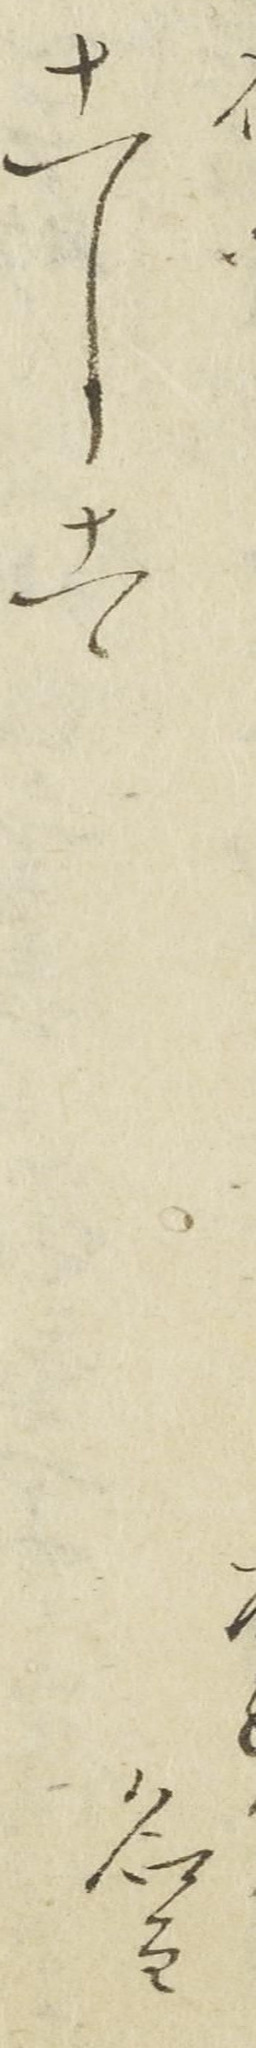十一月十一日名主
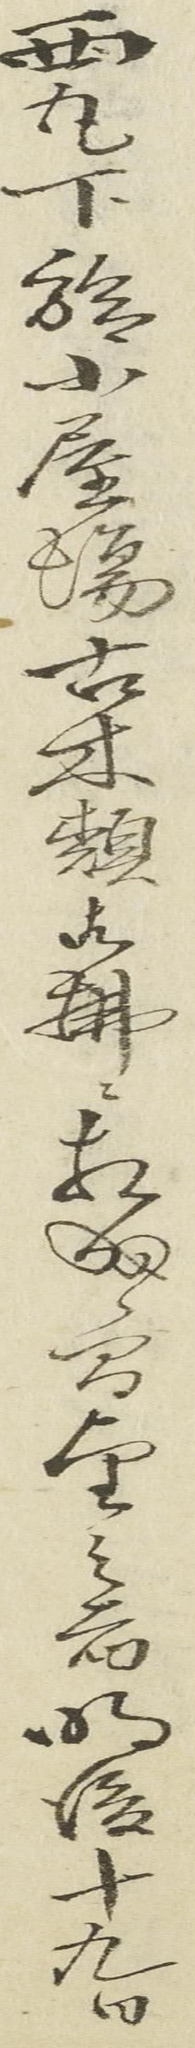西丸下施？小屋場古木類売？払ニ相成候間望之者明後十九日
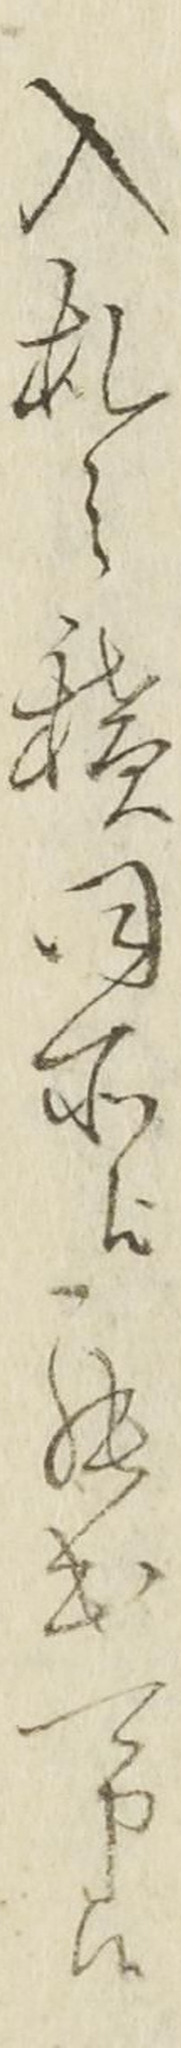入札之積同所え罷出可申候
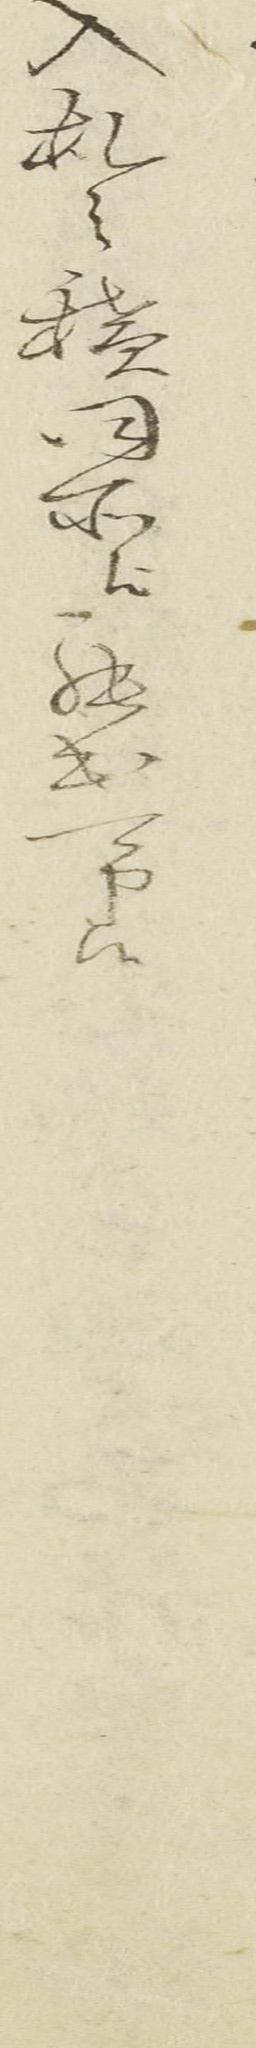入札之積同所え罷出可申候
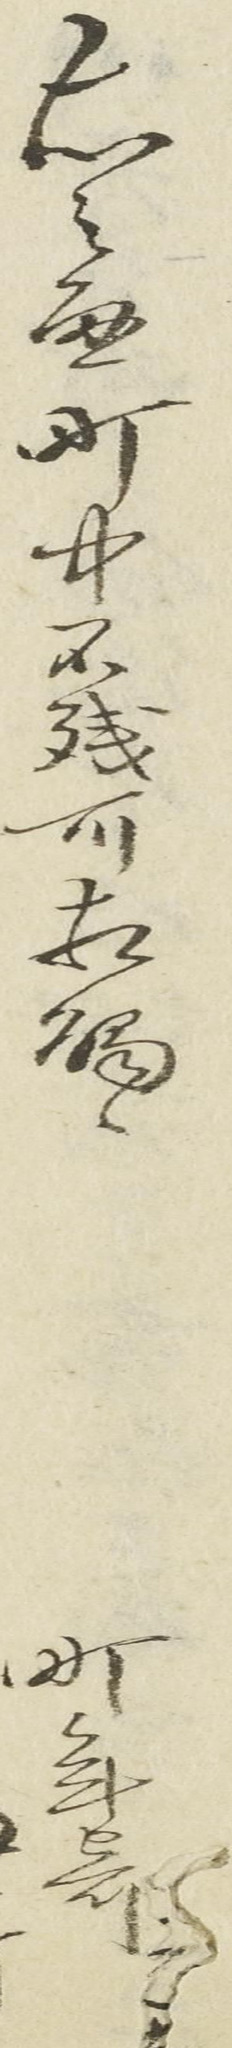右之通町中不残可相触候町年寄
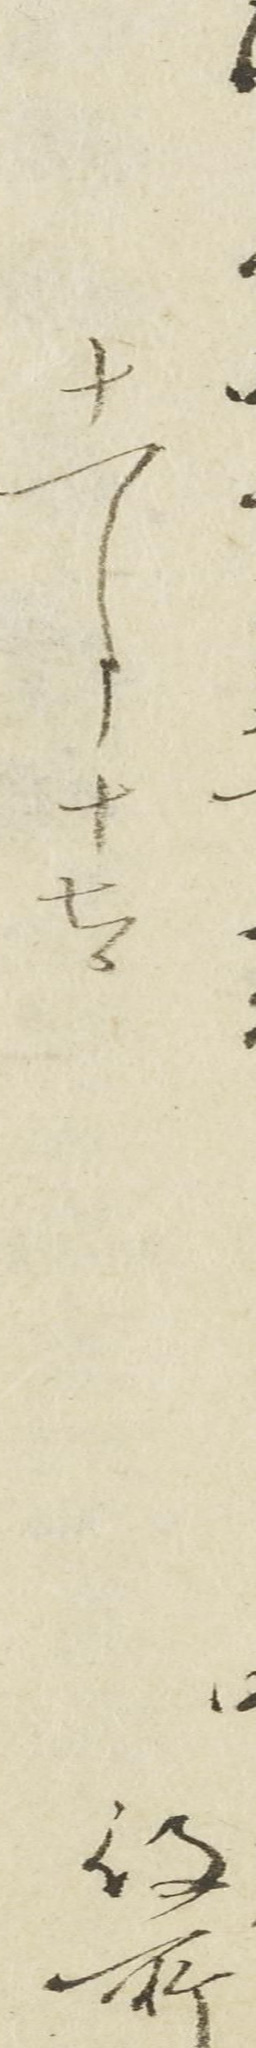十一月十七日役所
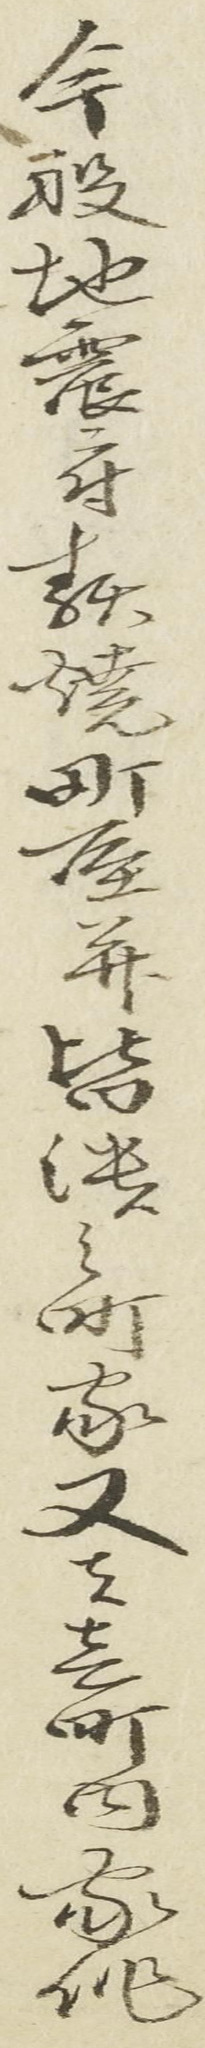今般地震ニ付類焼町家并皆潰之町家又は壱町内家作
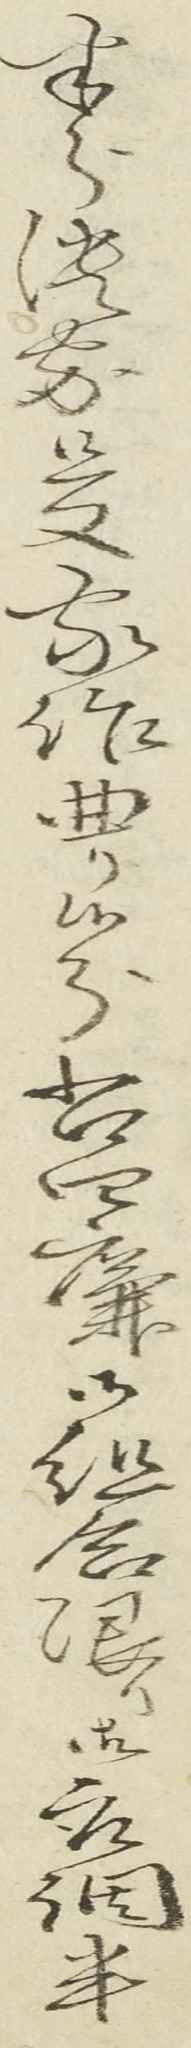半分潰家且又家作曲り候分右四廉御組合限り御取調半
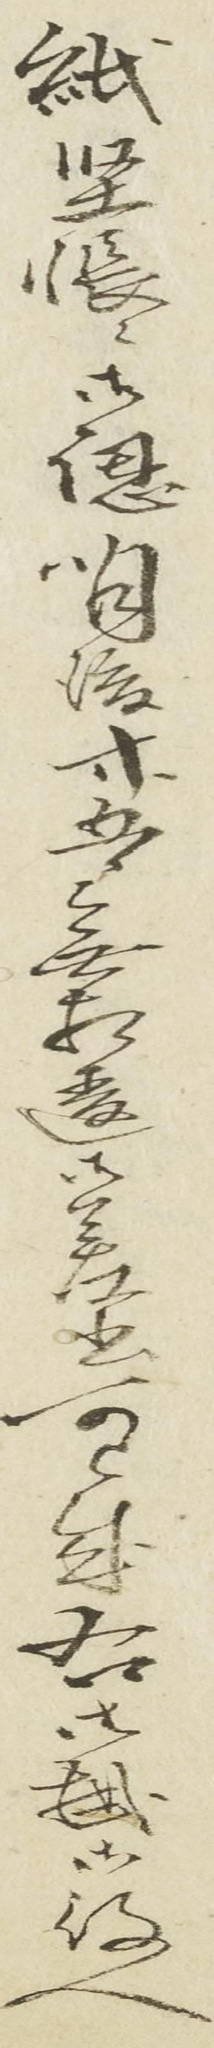紙堅帳ニ御認明後廿五日無相違御差出可被成右御掛御役人
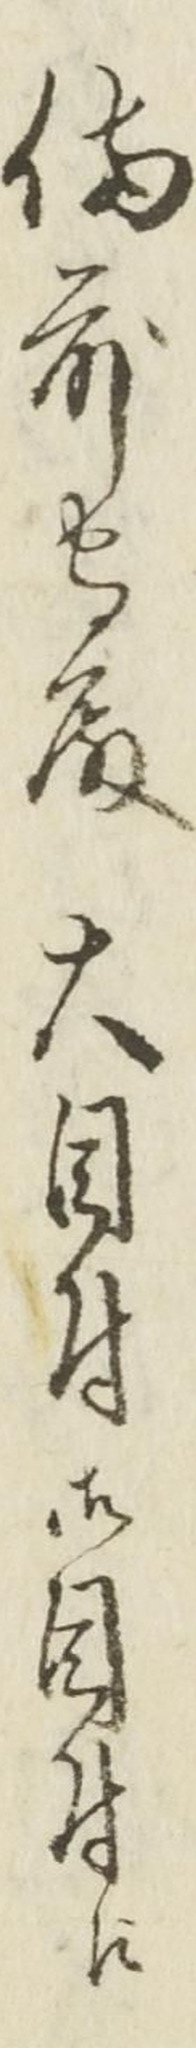備前守殿大目付御目付え
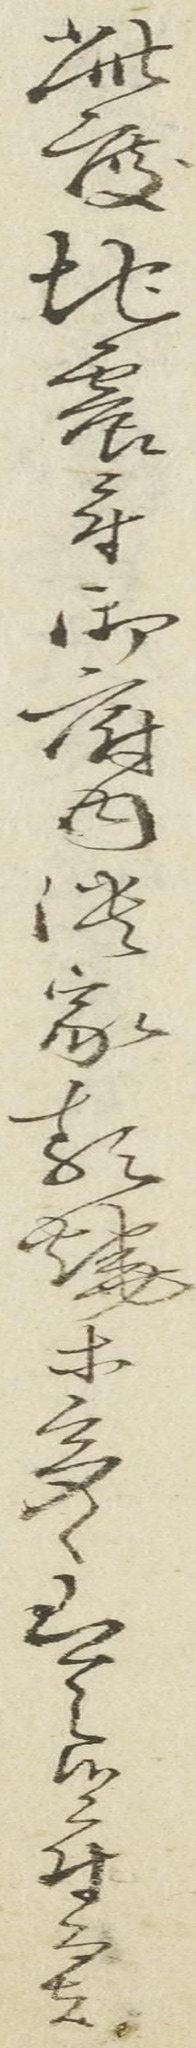此度地震二付御府内潰家類焼等多有之候ニ付而は
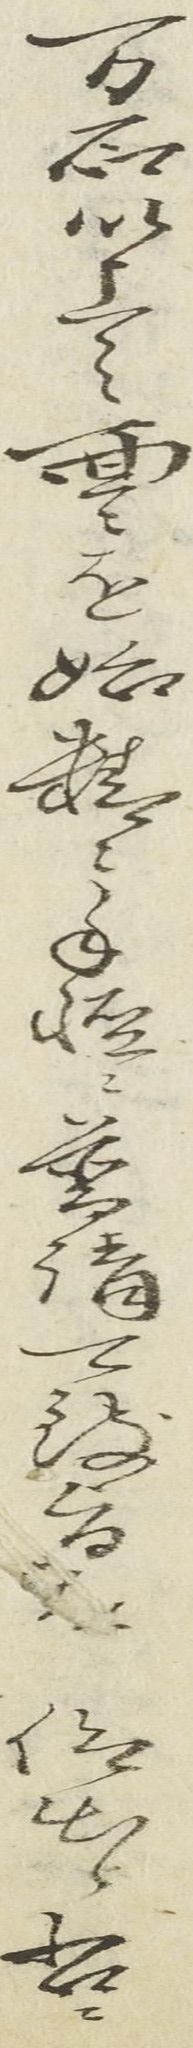万石以上之面々を始精々手軽二普請可致旨被仰出候右ニ
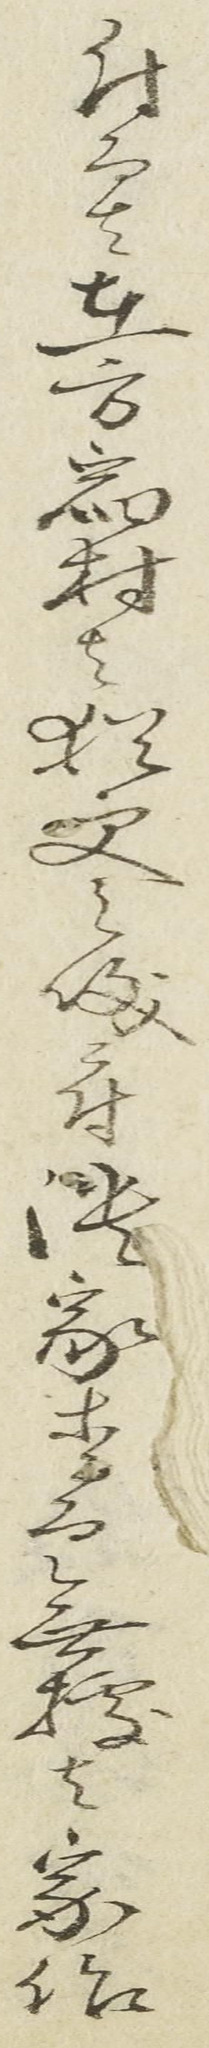付而は在方宿村は猶更之儀ニ付潰家等ニ而無拠は家作
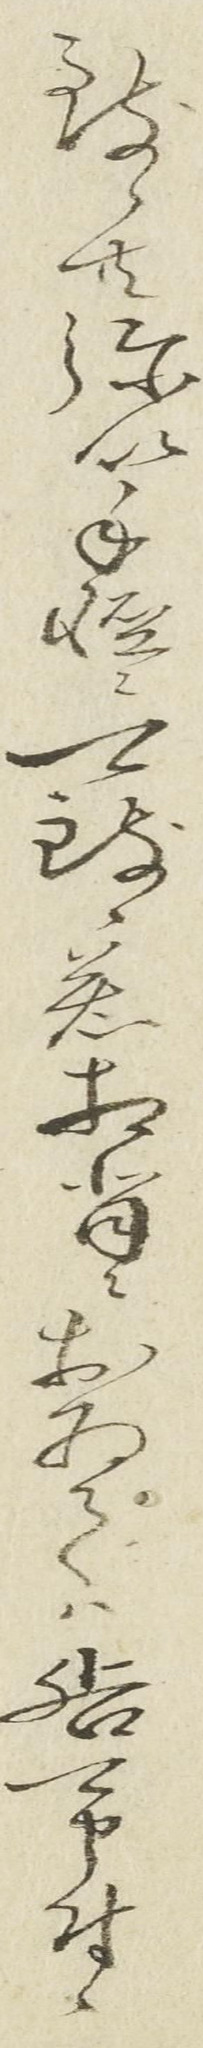致候共弥以手軽二可致候若相背ニおいてハ咎可申付候
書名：安政二乙卯年十月二日大地震之事
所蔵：東京大学地震研究所図書室 Earthquake Research Institute Library, The University of Tokyo, JAPAN
